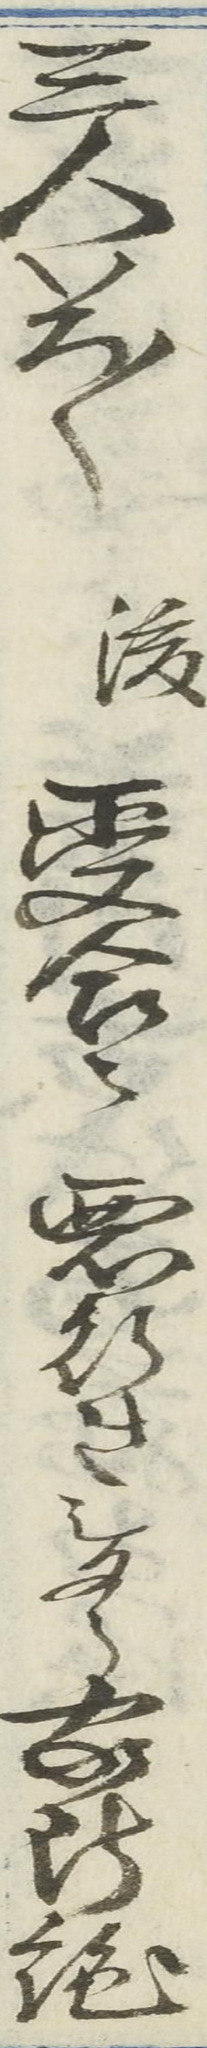三人いろ〳〵後受合之悪行さシタラ家断絶
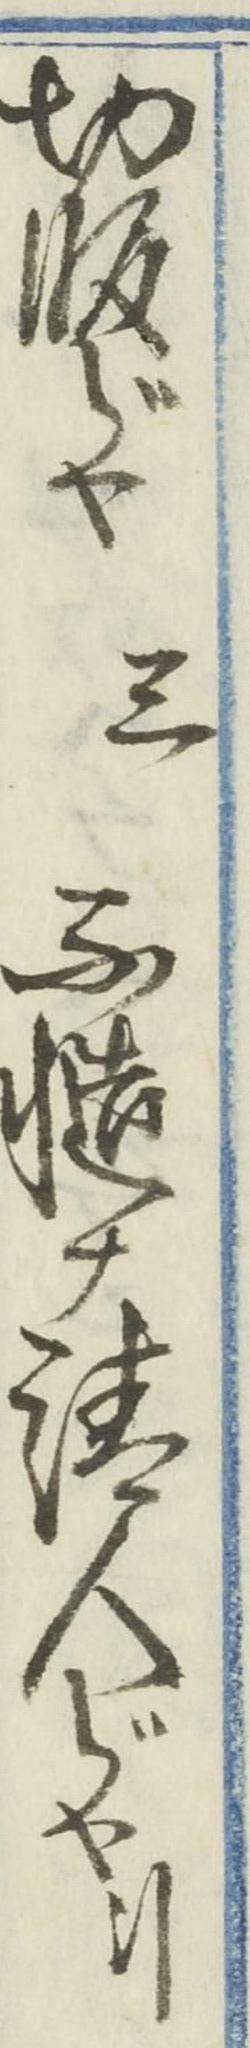切腹ぢヤ三不慥ナ請人ぢヤ
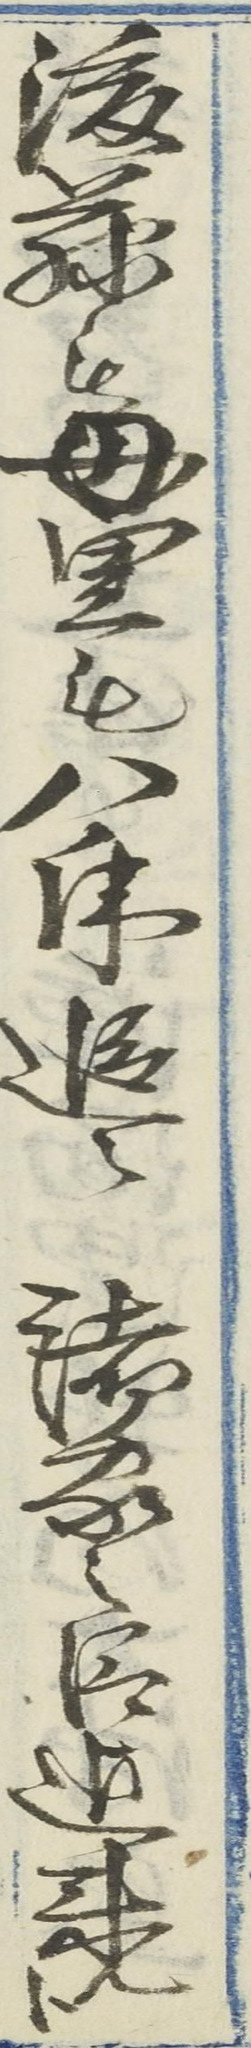後藤も母里も八虎追々諸家之臣迄来ルト
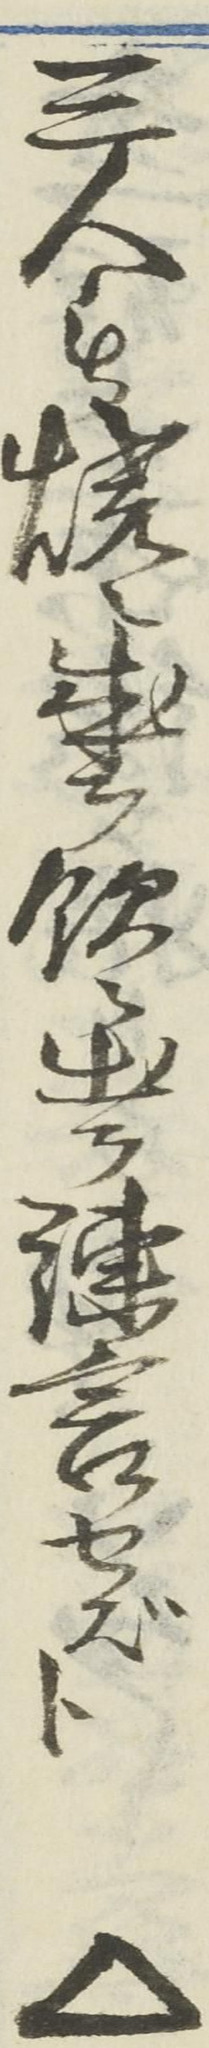三人も焼し成ヲ飲ニ出テ諌言セズト
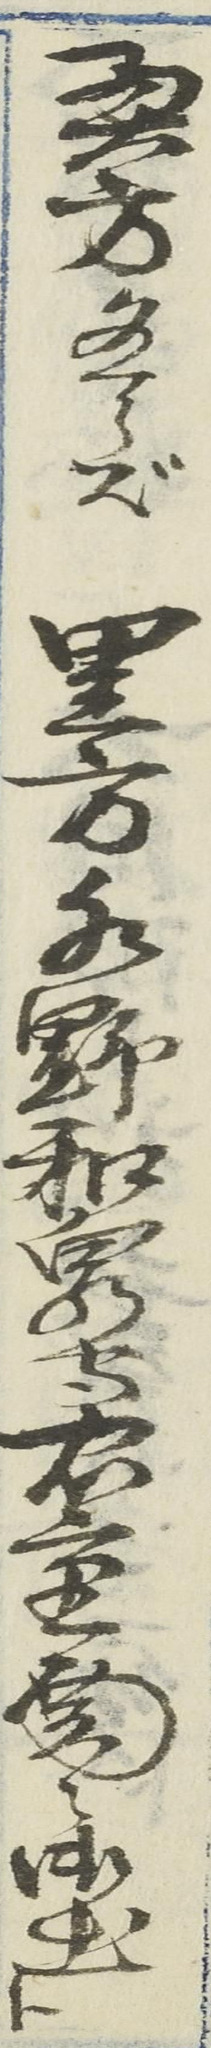奥方有らズ里方水野和泉忠重殿ニ御出ト
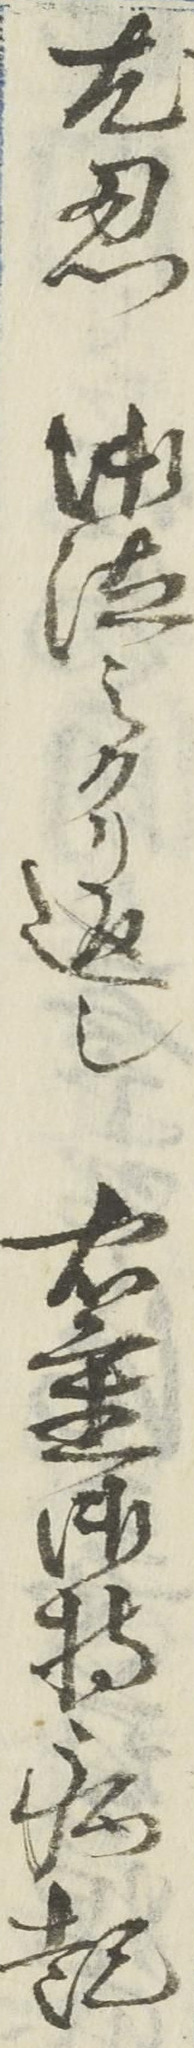尤忍御泣之クリ返し忠重御持病起
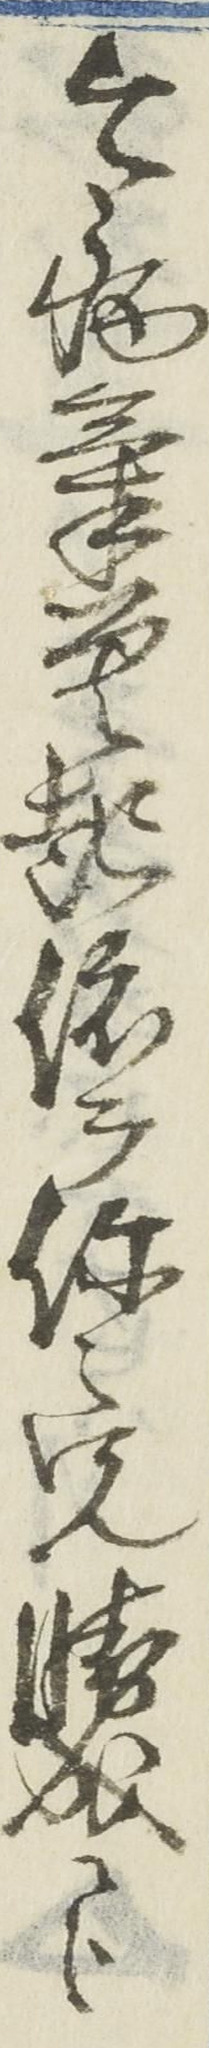今病氣差起依テ你之兄勝成ニト

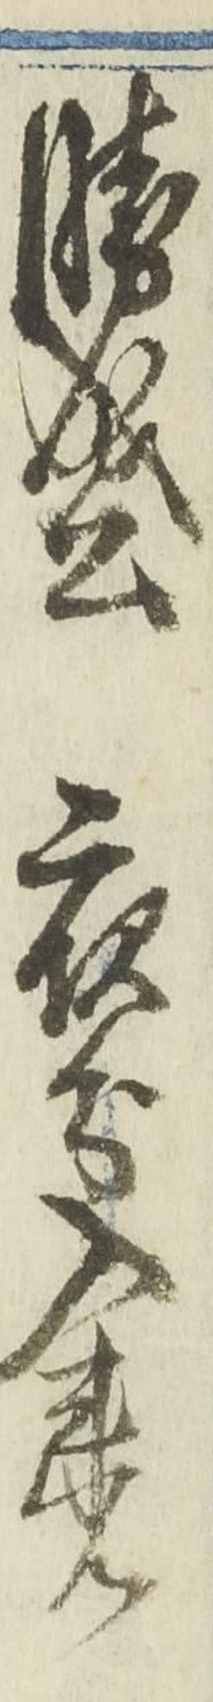勝成公夜分入来ル
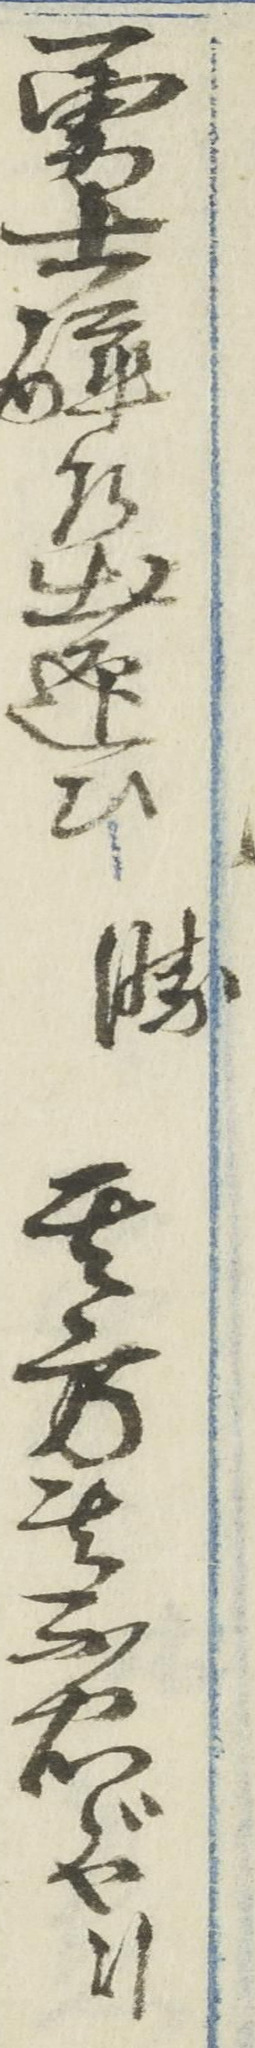勇士酔乍出迎ひ勝其方共不忠じや
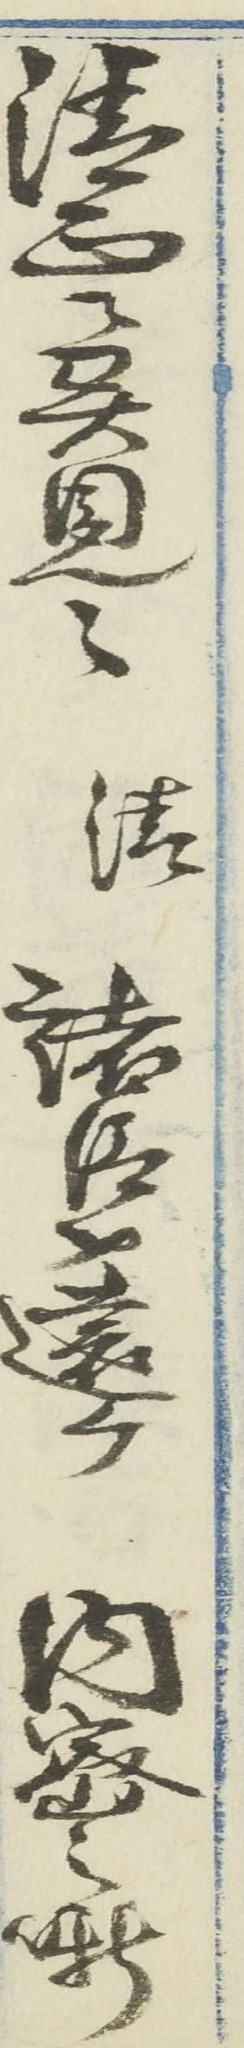清正ニ異見二清諸臣ヲ遠ケ内密之噺
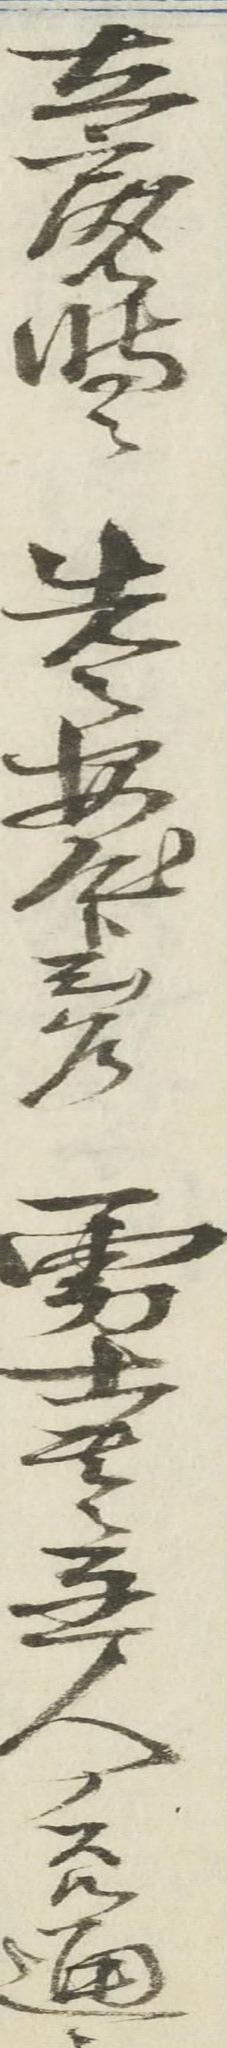立戻ル時ニ先ニ安心ト云乍勇士共二主人ノスル通ニ
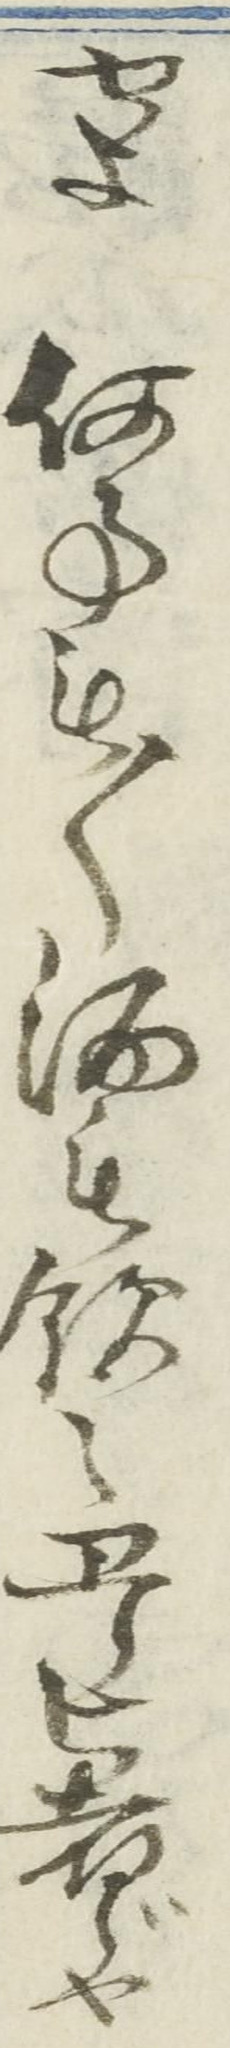セよ何事も〳〵酒も飲しエラヒ者じや
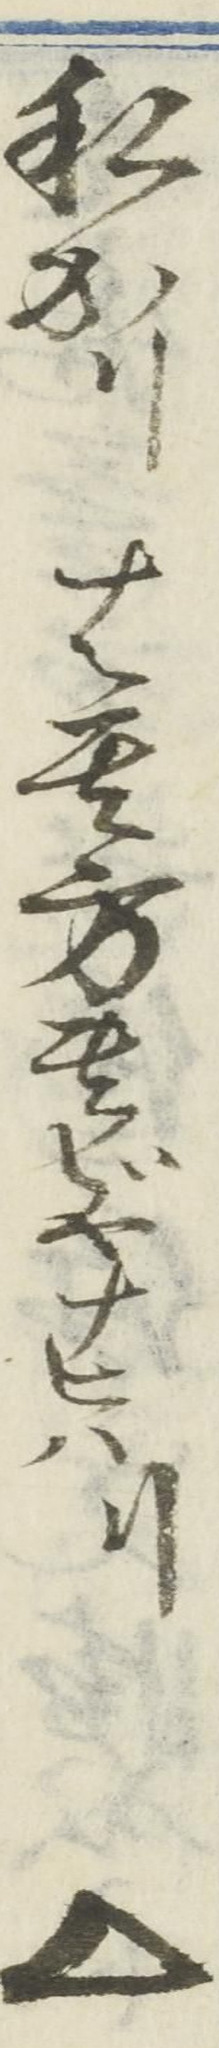私ナニ其方共じやナヒハ△
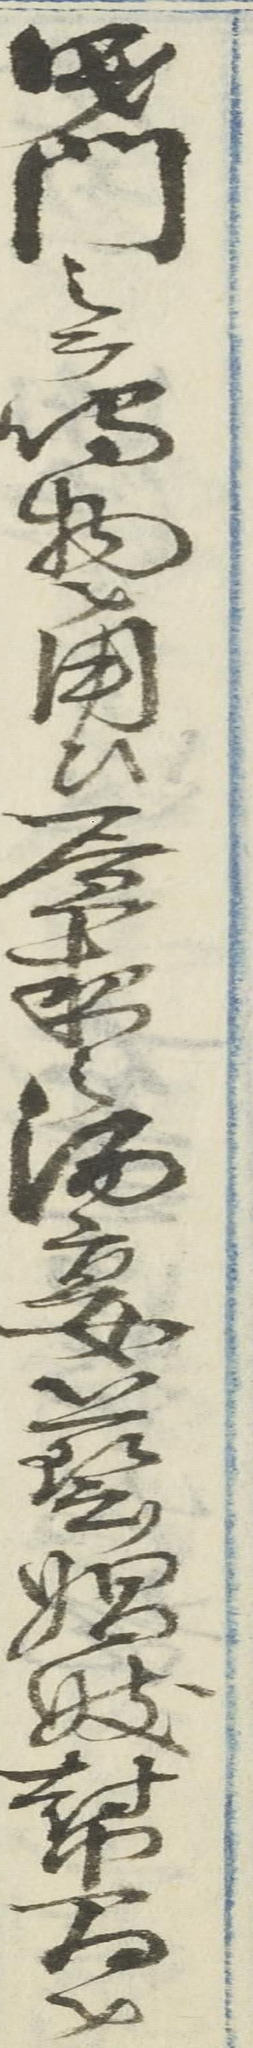閉門シテ傳物ヲ用ひ昼夜之酒宴藝娼妓幇間ヲ
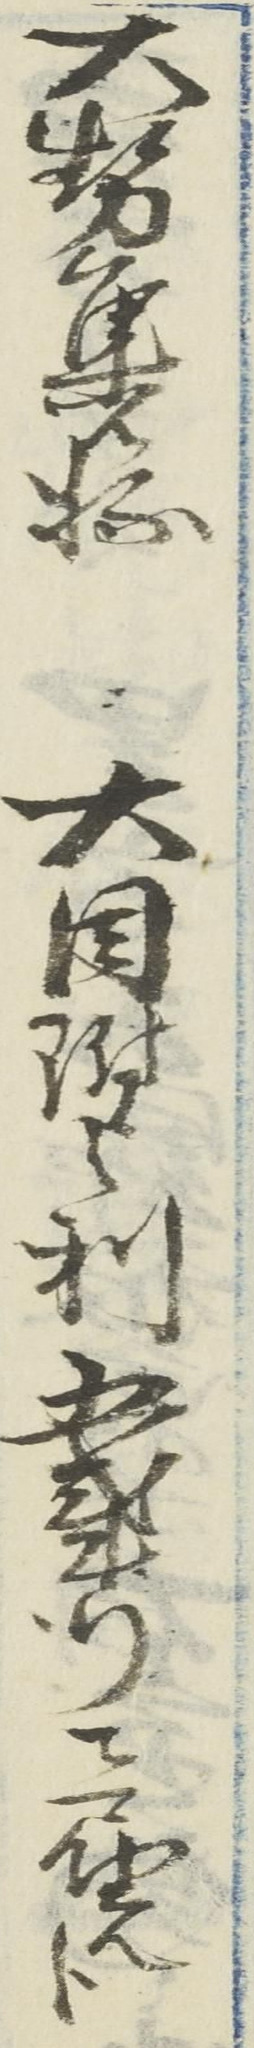大勢集ル抔大目附之利五奉行ニ届んト
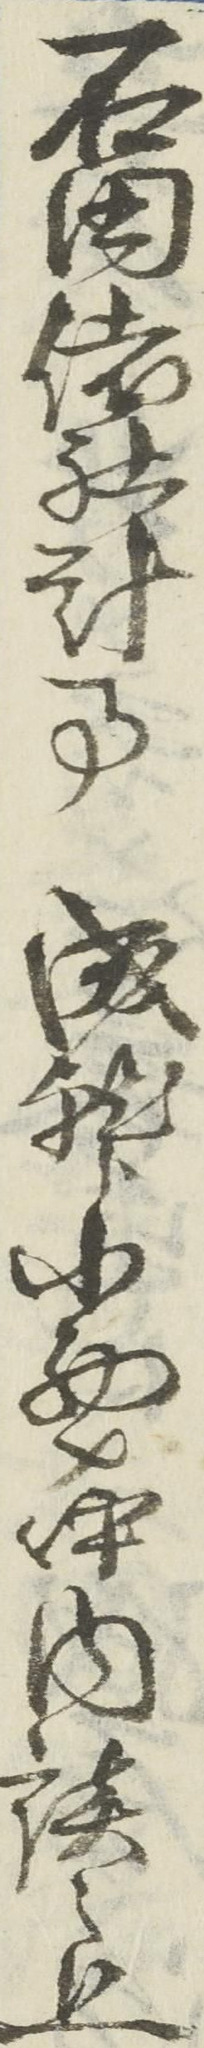石田偖社計事成就ト小西ヲ呼内談之上
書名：伏水大地震
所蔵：東京大学地震研究所図書室 Earthquake Research Institute Library, The University of Tokyo, JAPAN
